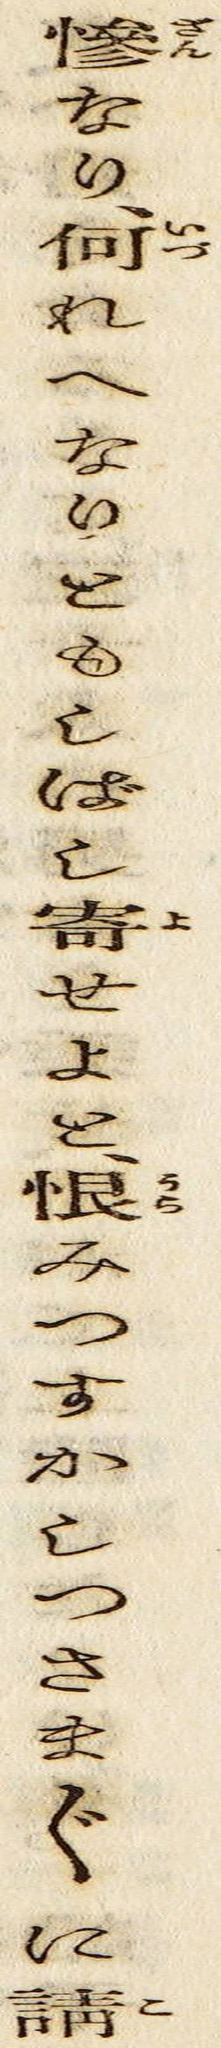惨なり、何れへなりともしばし寄せよと、恨みつすかしつさま〴〵に請
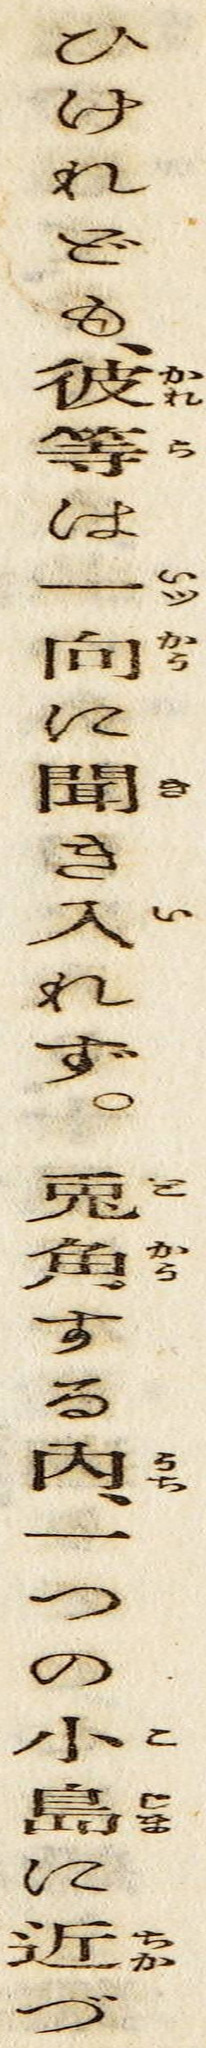ひけれども、彼等は一向に聞き入れず。兎角する内、一つの小島に近づ
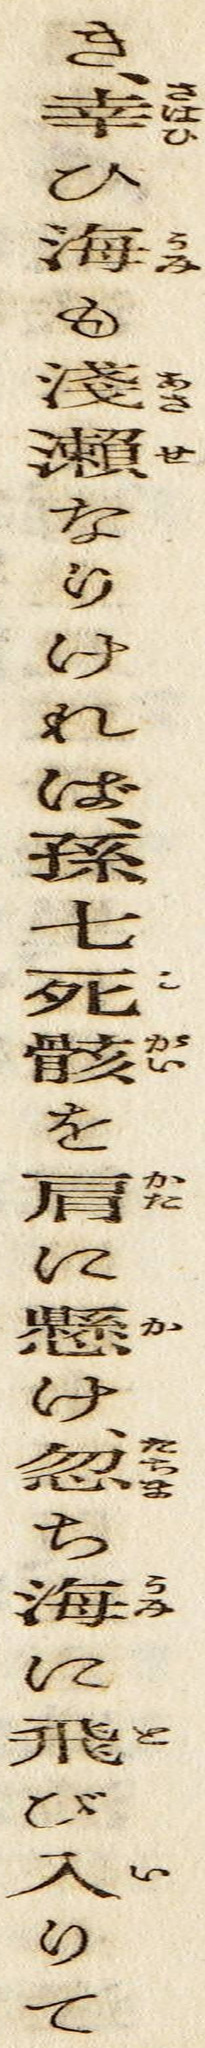き、幸ひ海も浅瀬なりければ、孫七死骸を肩に懸け、忽ち海に飛び入りて
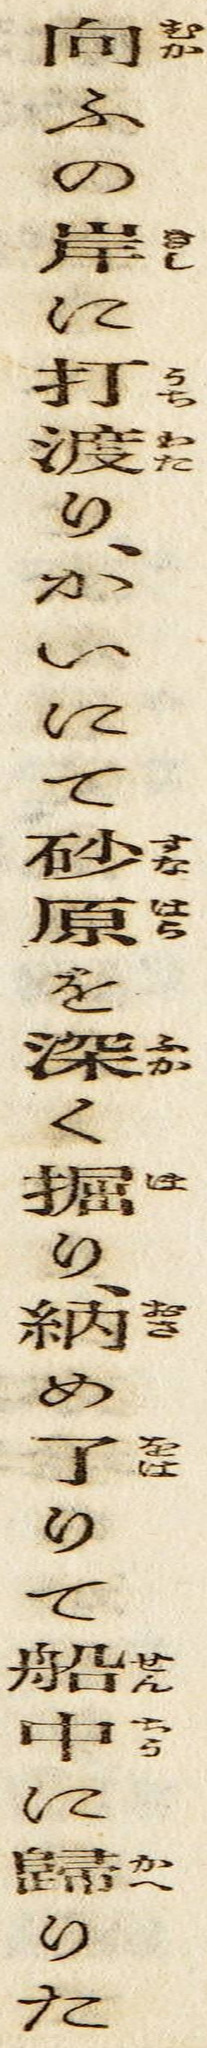向ふの岸に打渡り、かいにて砂原を深く掘り、納め了りて船中に帰りた
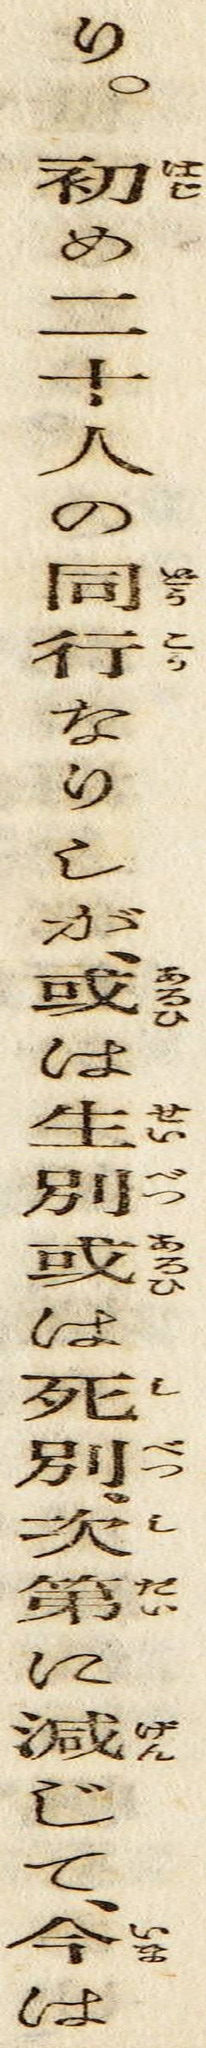り。初め二十人の同行なりしが、或は生別或は死別、次第に減じて、今は
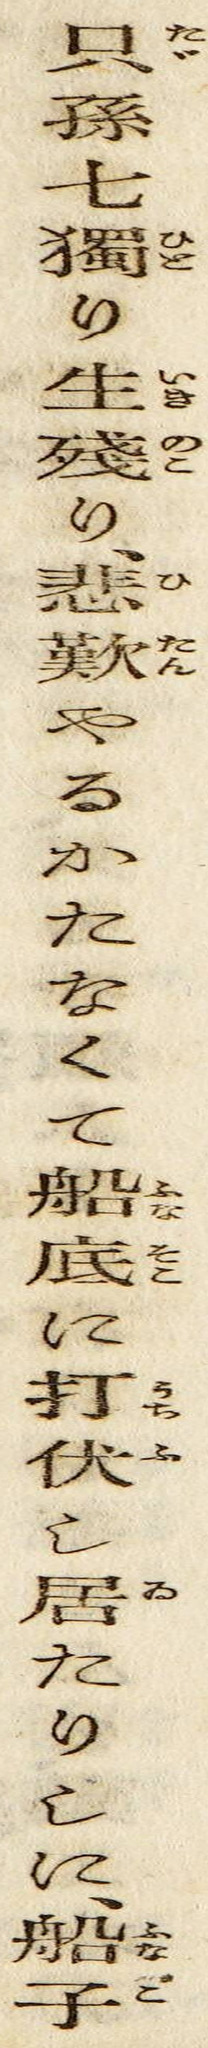只孫七独り生残り、悲歎やるかたなくて船底に打伏し居たりしに、船子

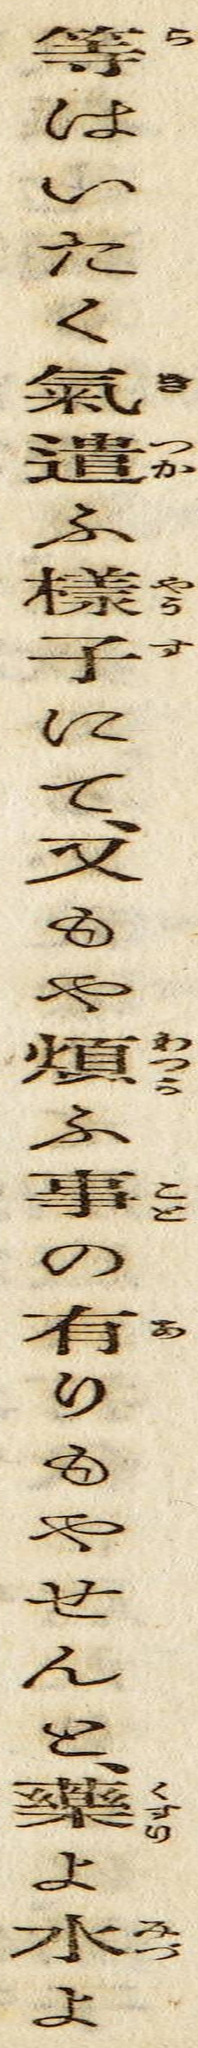等はいたく気遣ふ様子にて、又もや煩ふ事の有りもやせんと、薬よ水よ
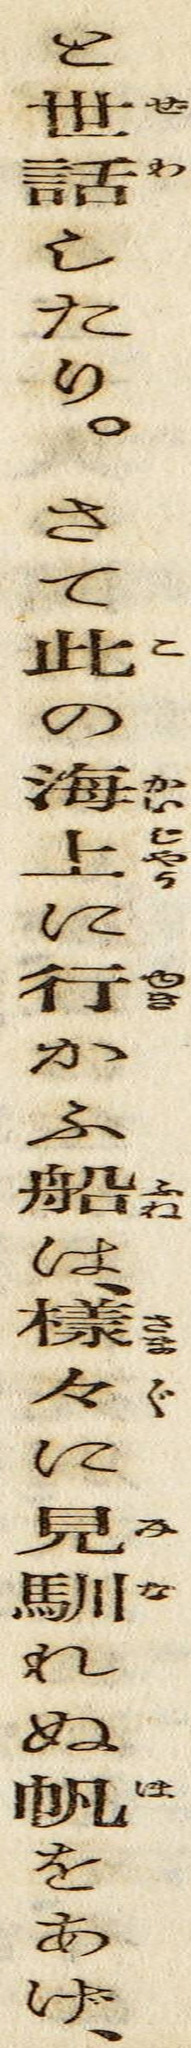と世話したり。さて此に海上に行かふ船は、様々に見馴れぬ帆をあげ、
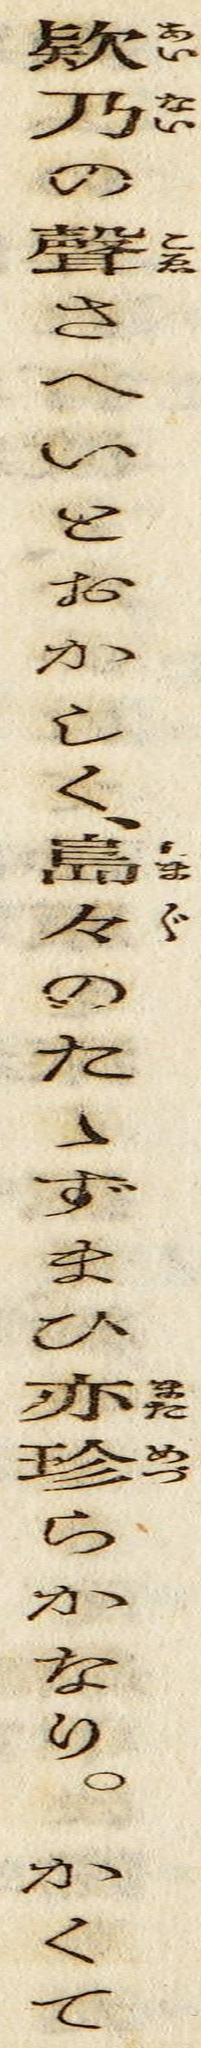款乃の声さへいとおかしく、島々のたゝずまひ亦珍らかなり。かくて
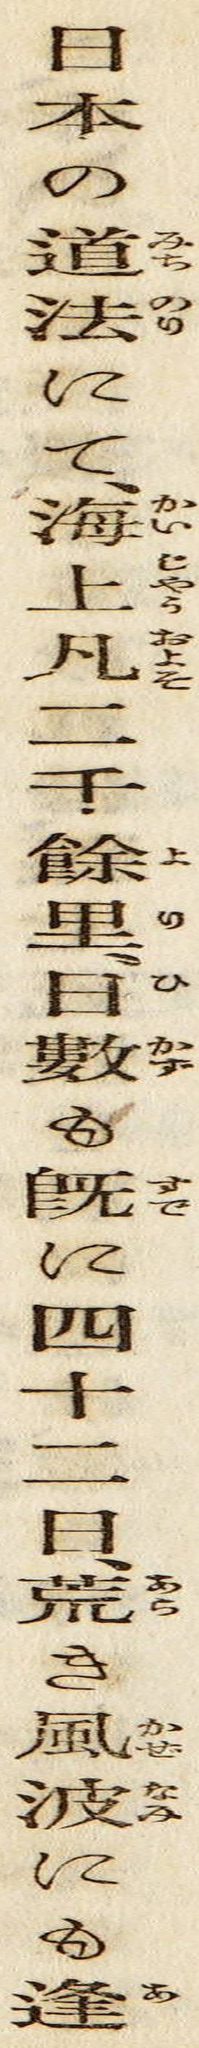日本の道法にて、海上凡二千余里、日数も既に四十二日、荒き風波にも逢
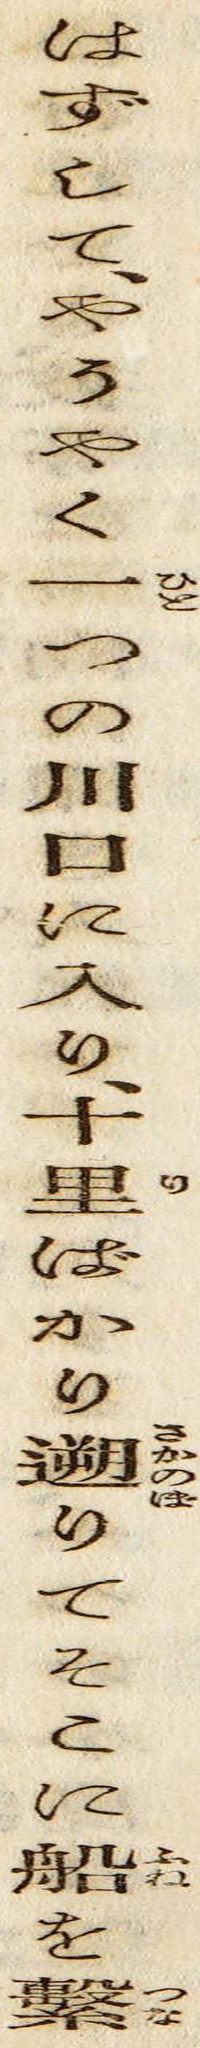はずして、やうやく一つの川口に入り、十里ばかり遡りてそこに船を繋
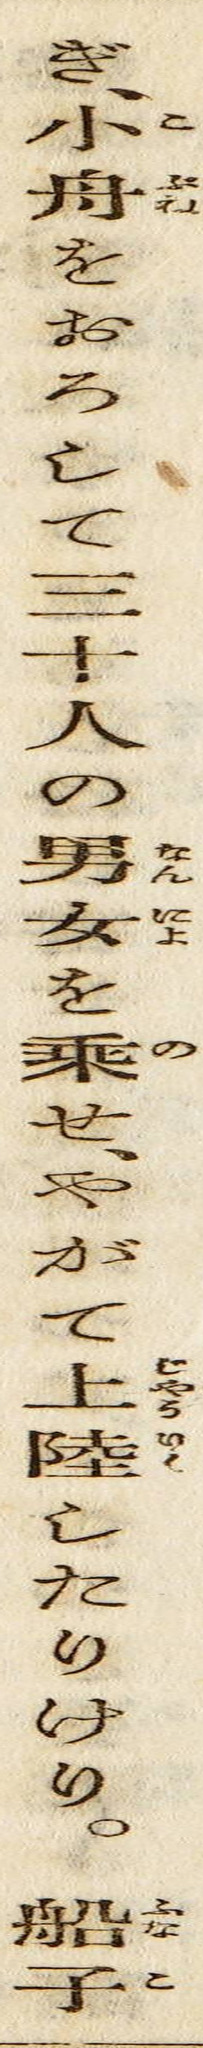ぎ、小舟をおろして三十人の男女を乗せ、やがて上陸したりけり。船子
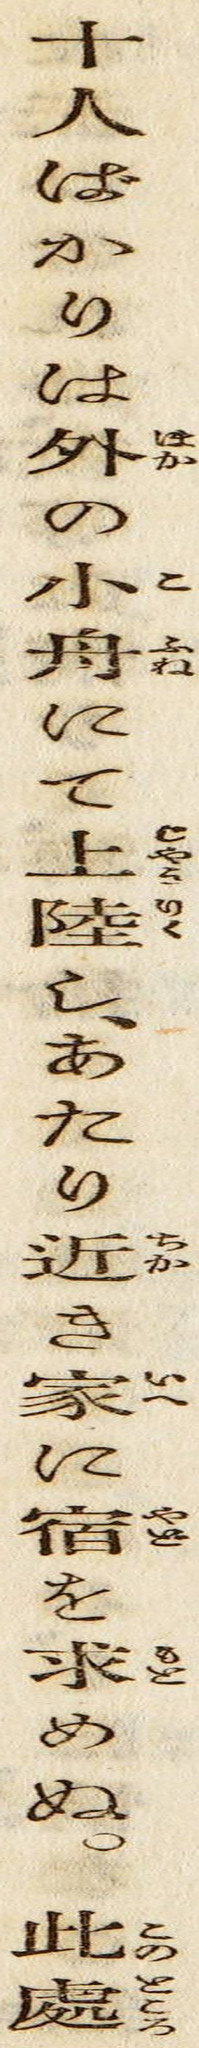十人ばかりは外の小舟にて上陸し、あたり近き家に宿を求めぬ。此処
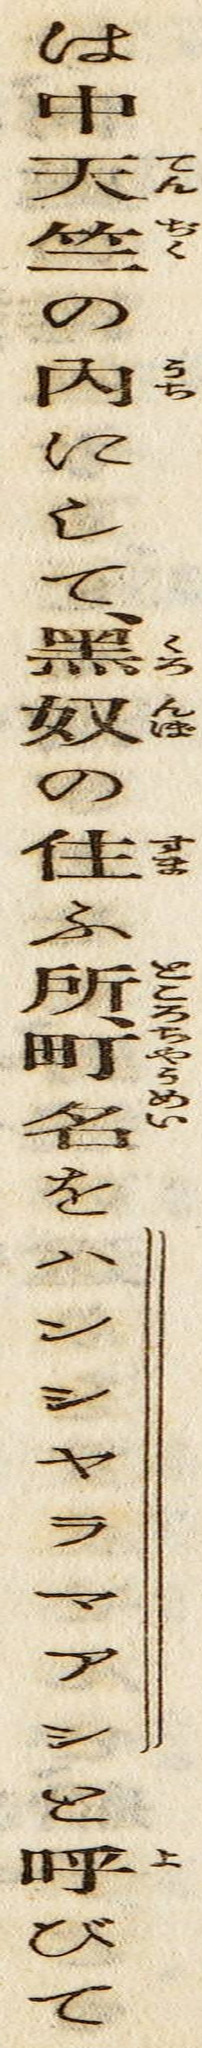は中天竺の内にして、黒奴の住ふ所、町名をハンシヤラマアシと呼びて
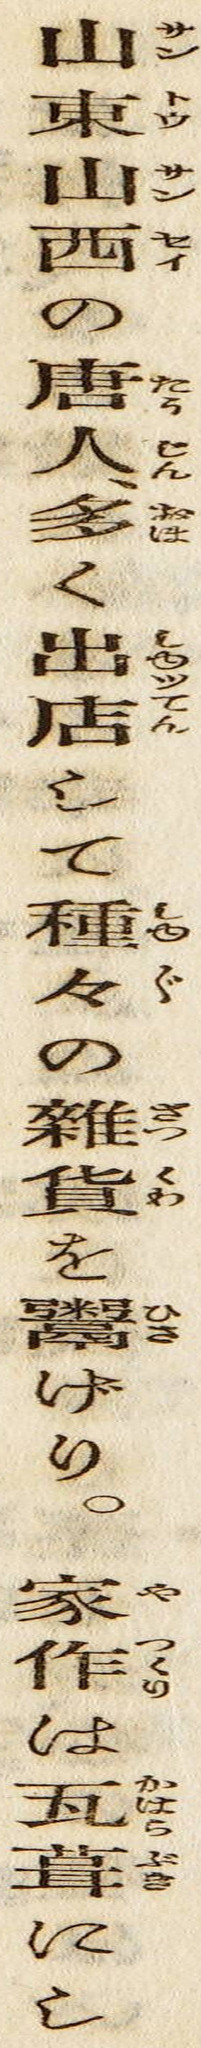山東山西の唐人、多く出店して種々の雑貨を粥げり。家作は瓦葺にし
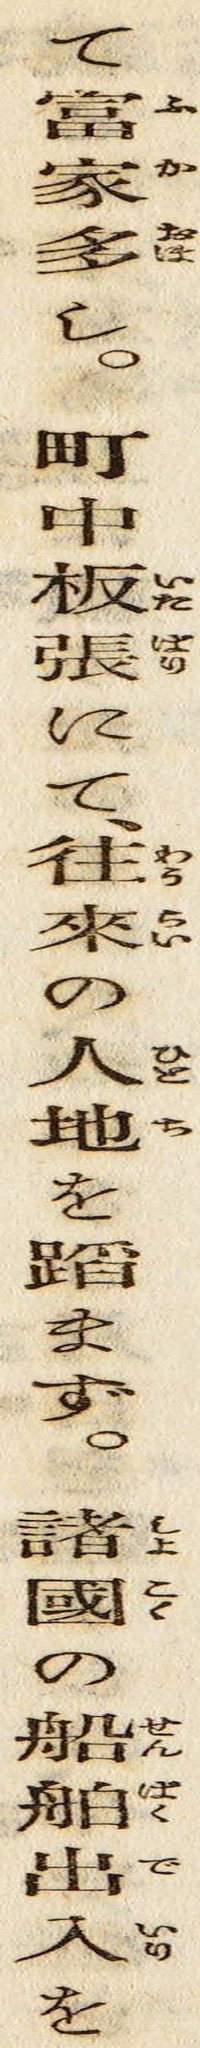て富家多し。町中板張にて、往来の人地を蹈まず。諸国の船舶出入を
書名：日本漂流譚
